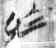於
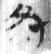丑
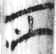工（空）
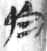於
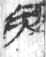寅
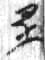坐
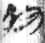於
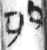卯
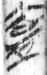盍（蓋）
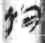於
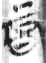晨
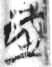城（成）
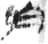於
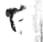巳
